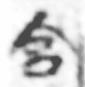宮
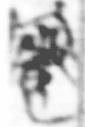廏
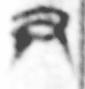尹
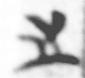之
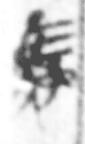駟
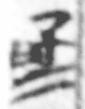爲
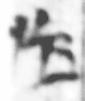○（左）
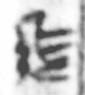飛（騑）
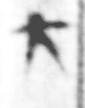大（太）
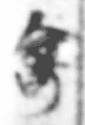宰
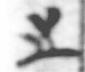之
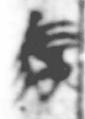駟
